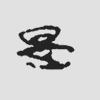是
